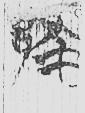○（蔡）
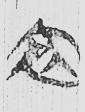哀
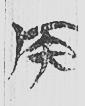侯
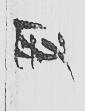取
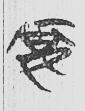妻
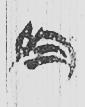於
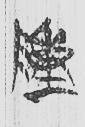陳
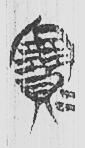賽=
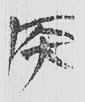侯
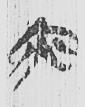亦
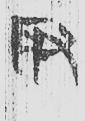取
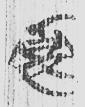妻
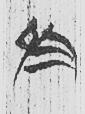於
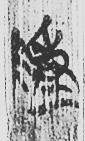陳
